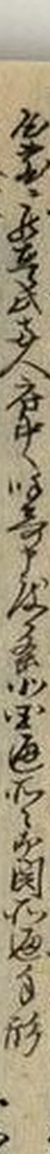屋敷ニ罷在候此両人府中へ呼寄申度候条北国通所々御関所通手形
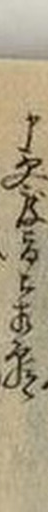申受度旨被相願候
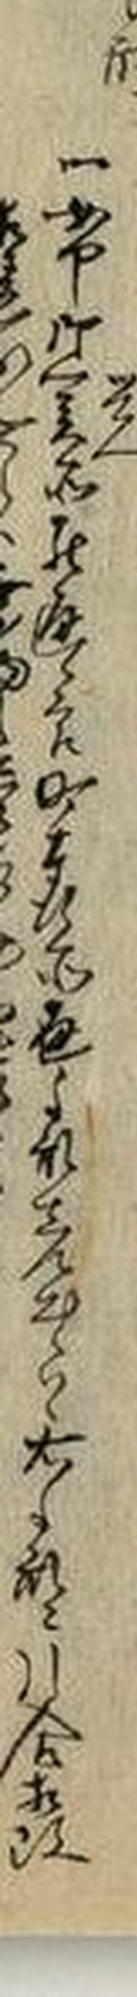一女中御関所罷通候節町奉行所通手形差出候ハヽ右手形と引合相改
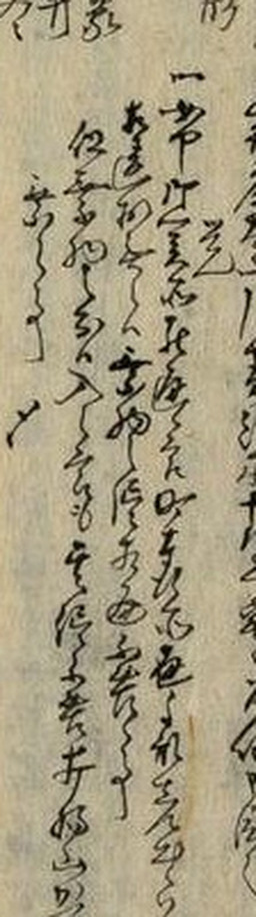相違於無之ハ乗物之儘相通不苦候事
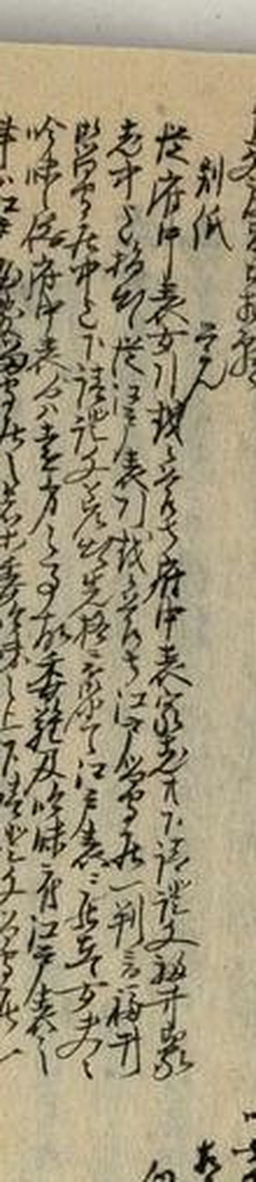老中迄指出候従江戸表引越候節者江戸留守居一判ニ而福井
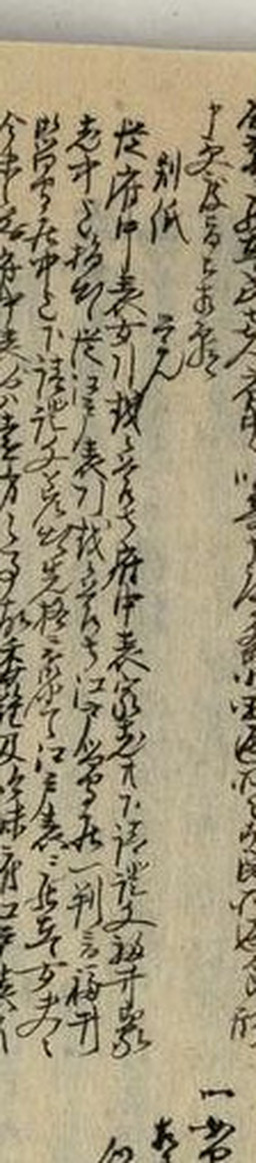従府中表女引越候節者府中表家老共下請証文福井御家
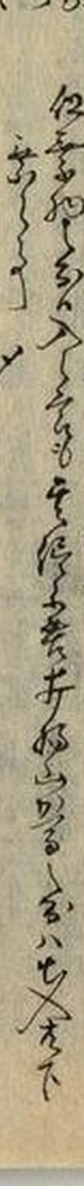但乗物之分ハ入候節も其儘不苦打帰山駕之分ハ出入共下
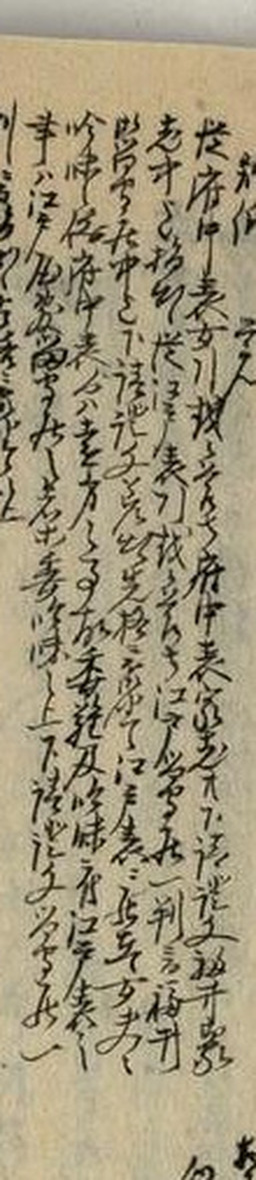御留守居中迄下請証文差出候先格ニ御座候江戸表ニ罷在候女夫々
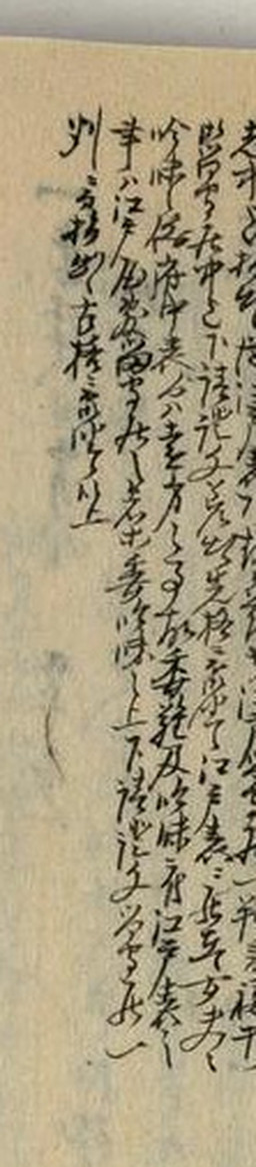事ハ江戸屋敷留守居之者等委吟味之上下請証文留守居一
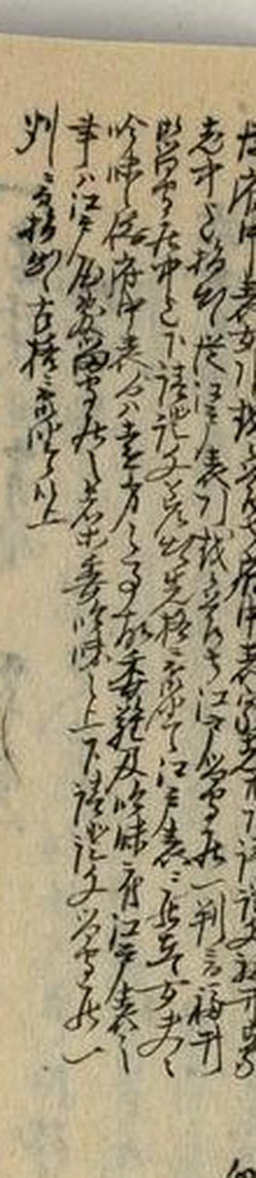吟味之儀府中表ゟハ遠方之事故委難及吟味ニ付江戸表之
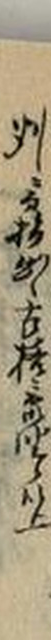判ニ而指出候古格ニ而御座候以上

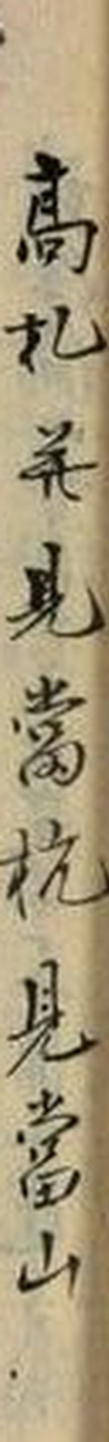高札幷見当杭見当山
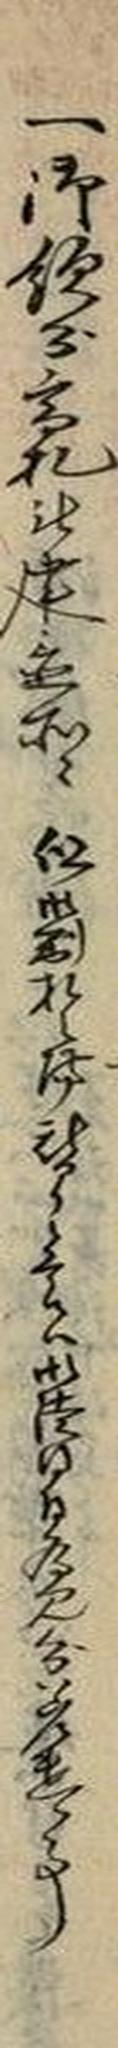一御領分高札被建置所々但御制札之場替り候節ハ御徒目付為見分差遣候事
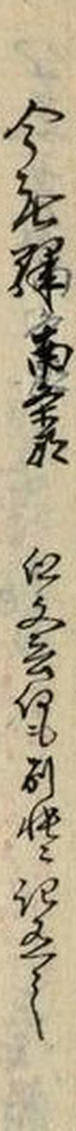今庄駅南条郡但文言何も別帳ニ記有之
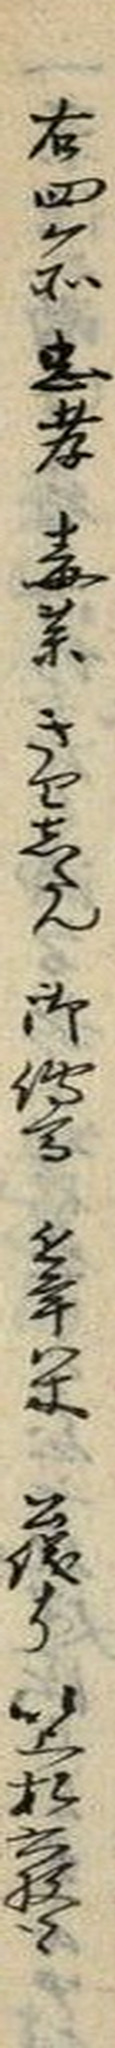右四ケ所忠孝毒薬きりしたん御伝馬近年米公儀より以上札六枚ツヽ
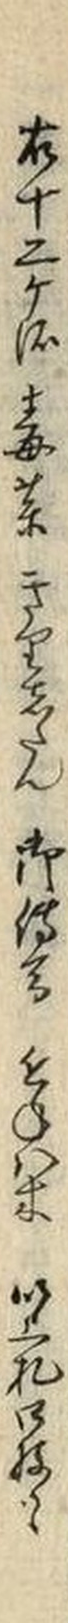右十二ケ所毒薬きりしたん御伝馬近年米以上札四枚ツヽ
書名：御国他国諸事之部
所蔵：福井県文書館 Fukui Prefectural Archives
